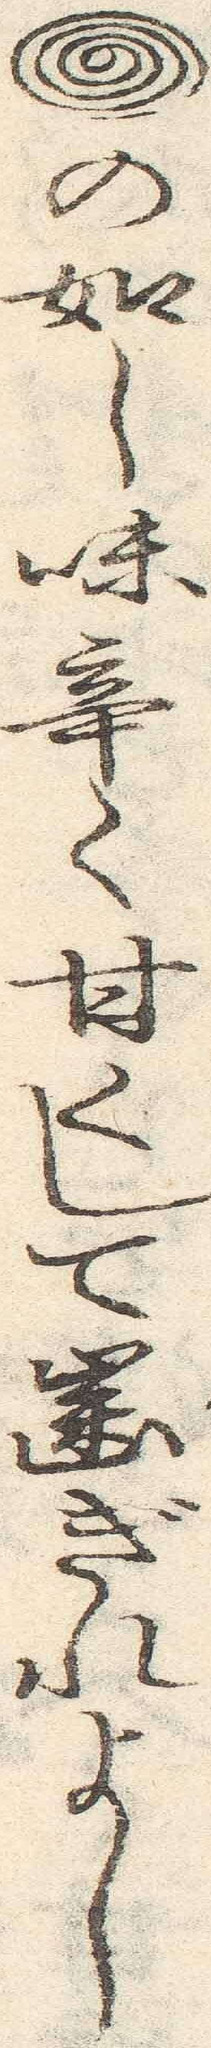の如し味辛く甘くして歯ぎれよし
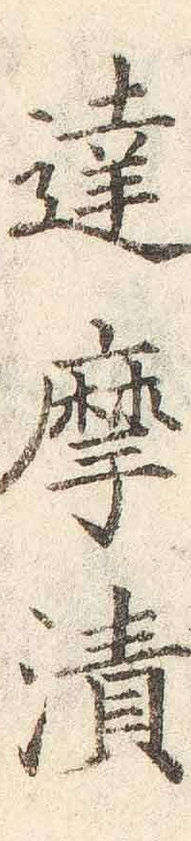達摩漬
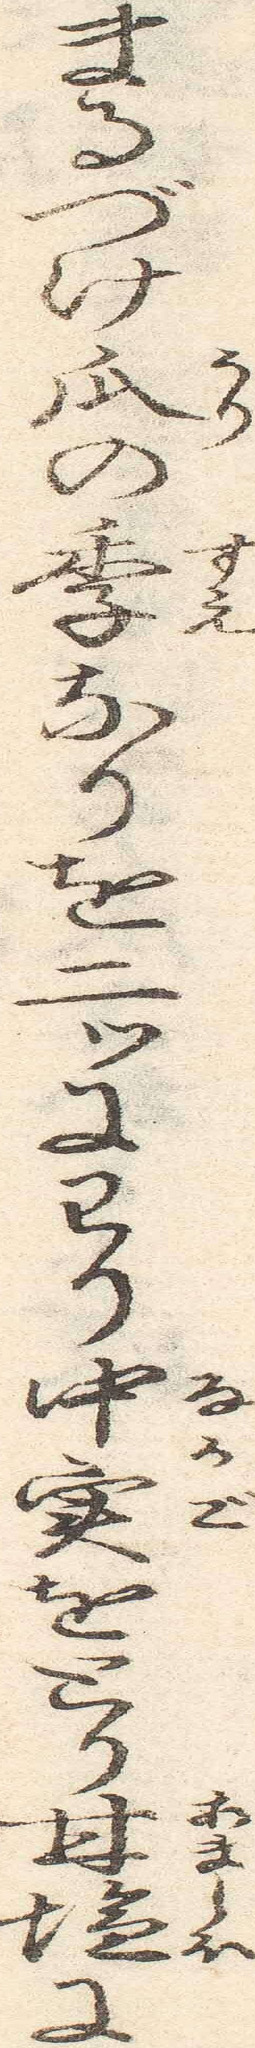まるづけ瓜の季なりを二ッにわり中実をとり甘塩に
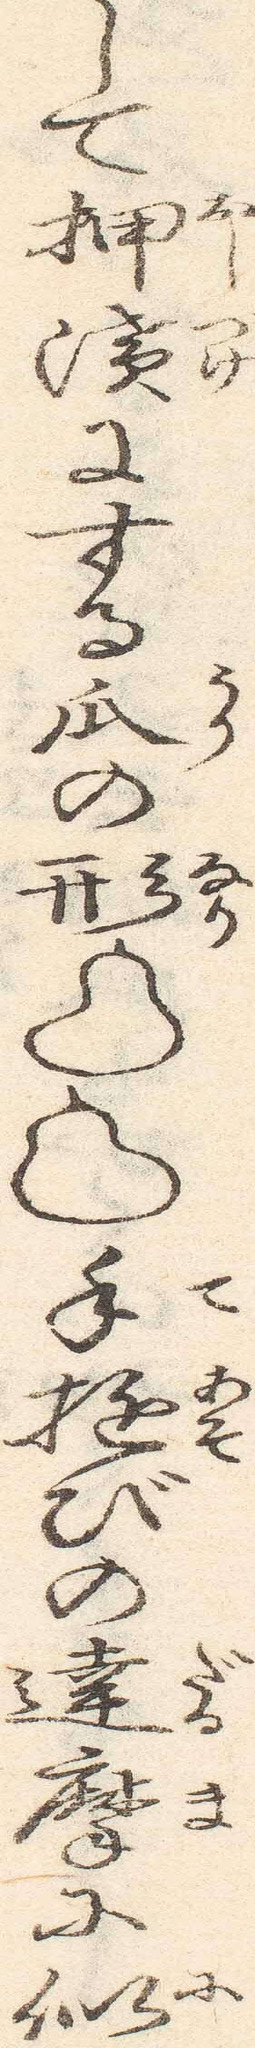して押漬にする瓜の形手遊びの達摩に似
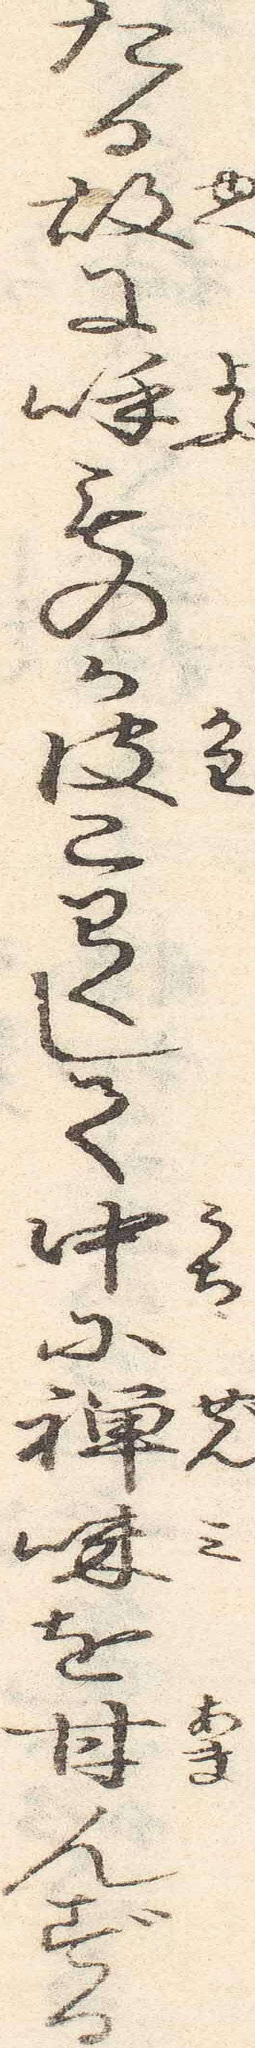たる故に呼ものか皮こわくして中に禅味を甘んずる
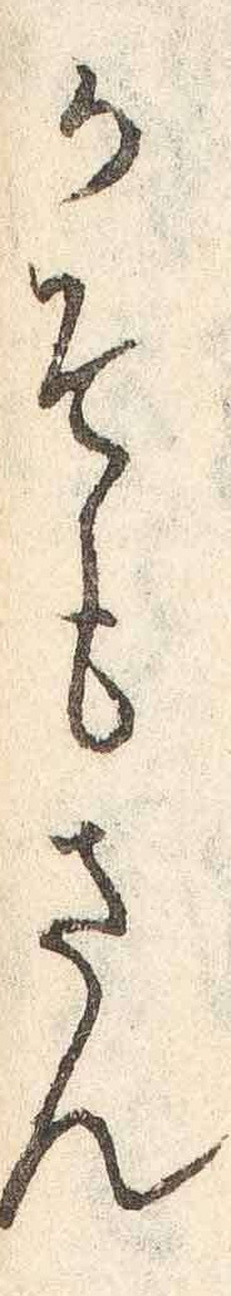かそもさん
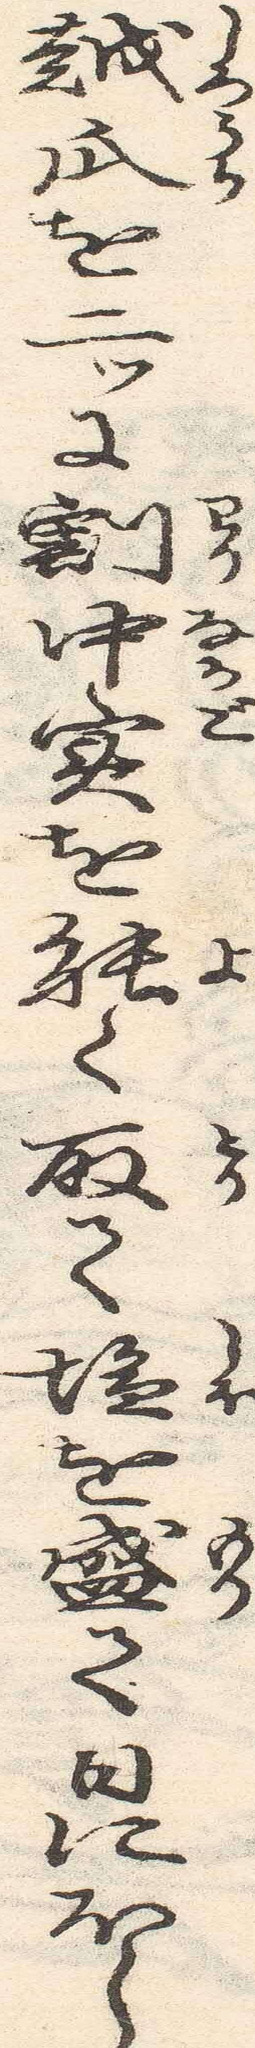越瓜を二ッに割中実を能く取て塩を盛て日にほし
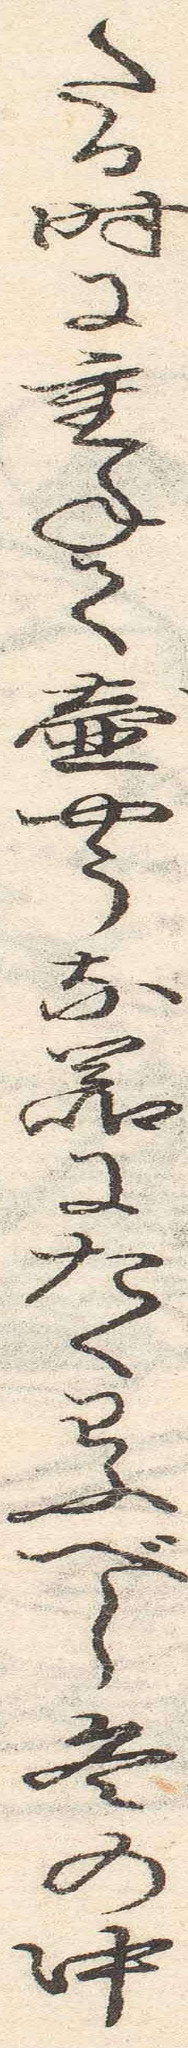たる時に重ねて壺やうな器にたくわふべし冬の中
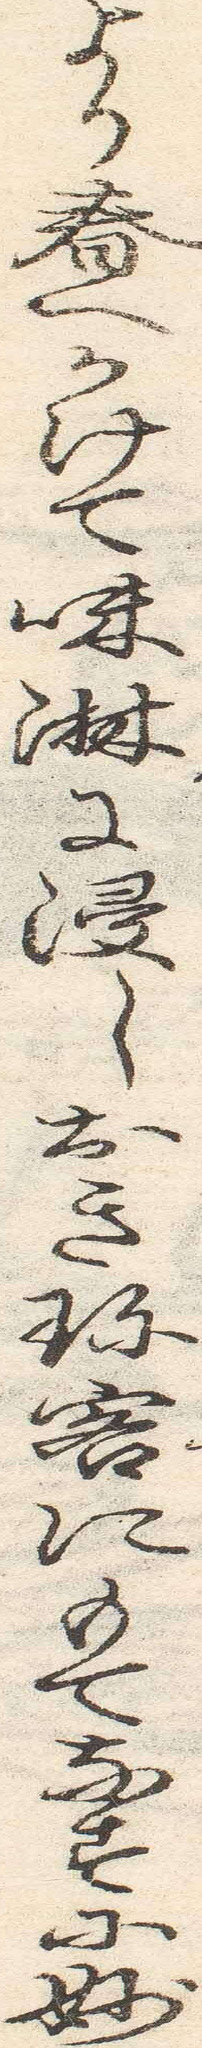より春へかけて味淋に浸しおき珍客にもてなすに妙
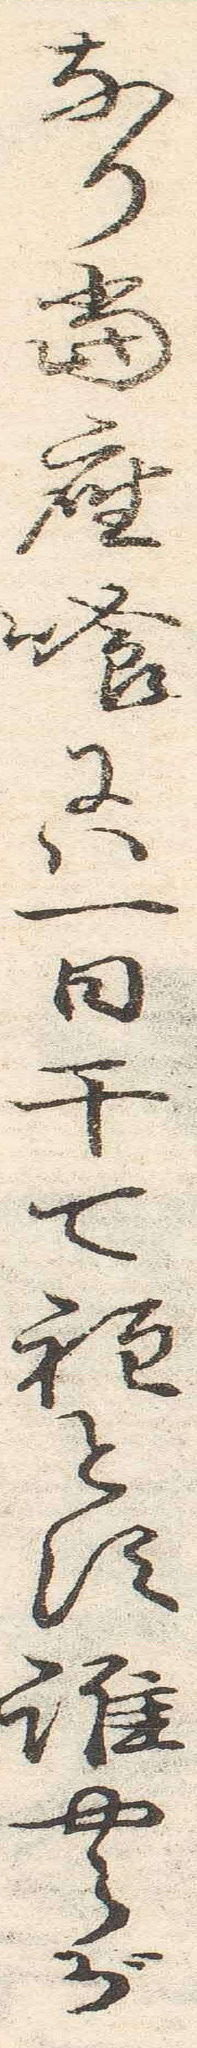なり当座喰には一日干て程とす誰やらが
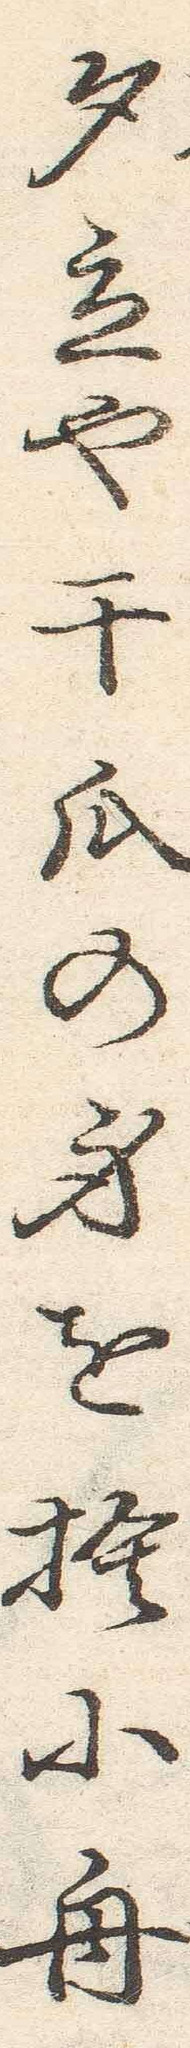夕立や干瓜の身を捨小舟
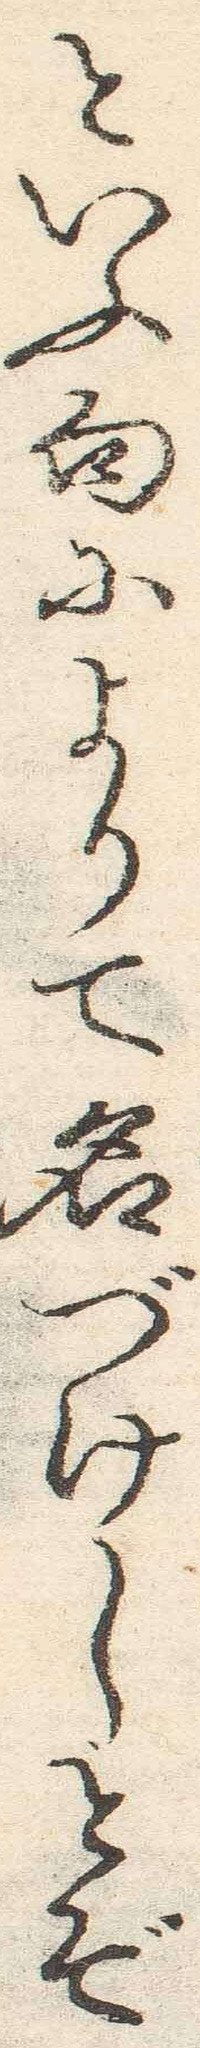といふ句によりて名づけしとぞ
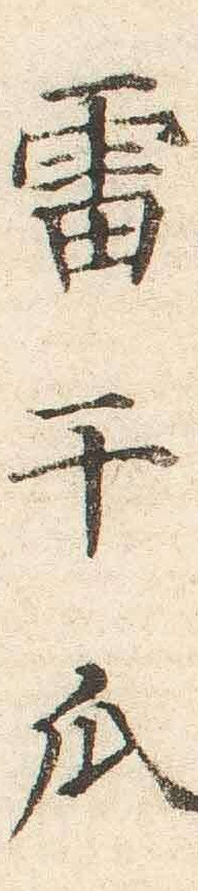雷干瓜

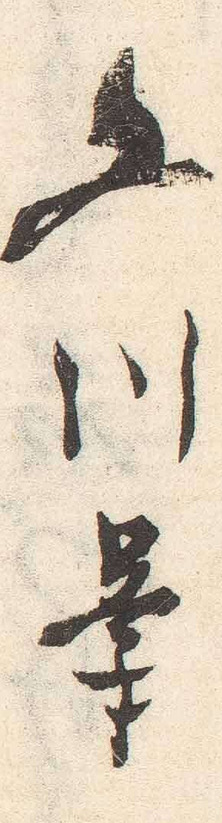文川筆
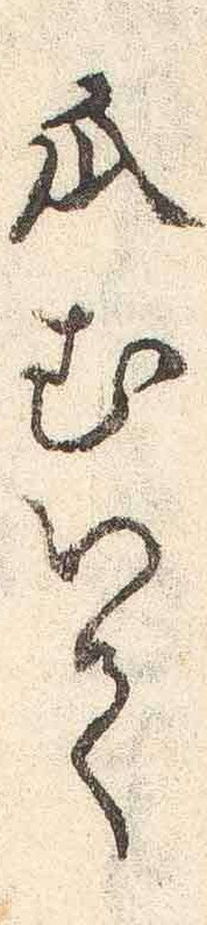瓜むいて
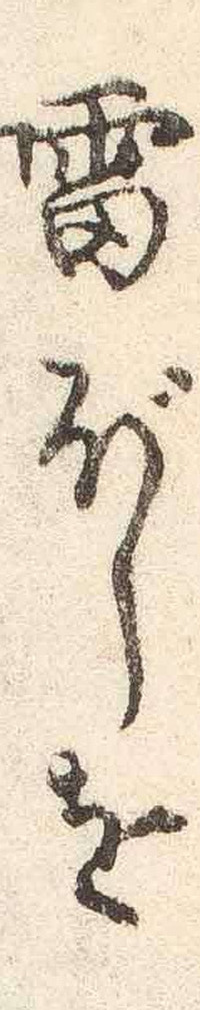雷ぼしを
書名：四季漬物塩嘉言
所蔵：東京学芸大学附属図書館 国文学研究資料館
